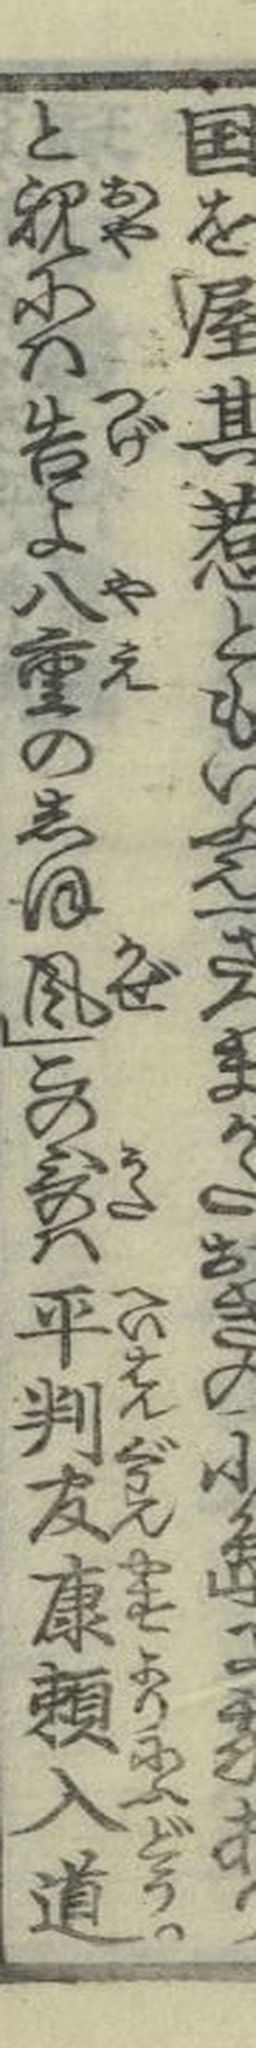と親には告よ八重のしほ風」この歌は平判官康頼入道。
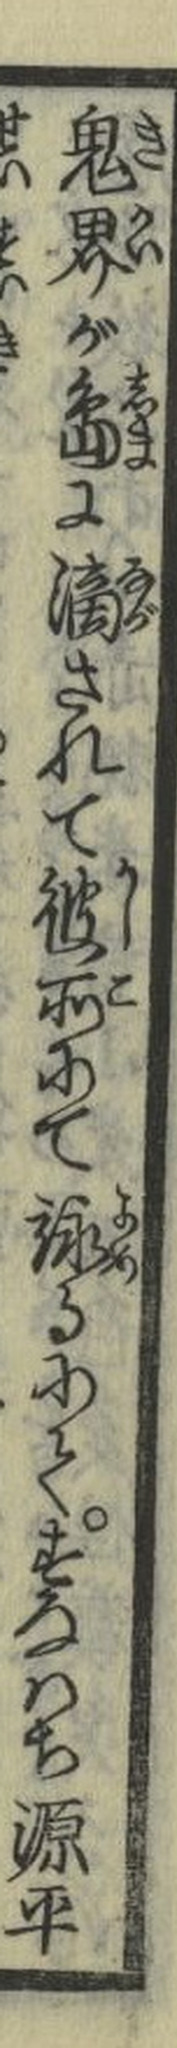鬼界ヶ島に謫されて彼所にて詠るにて。すなはち源平
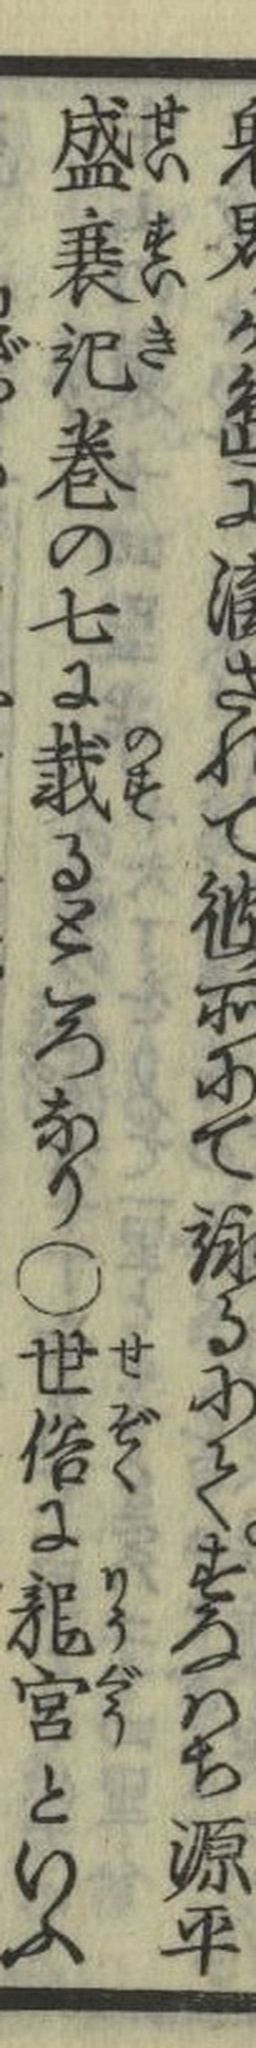盛衰記巻の七に載るところなり○世俗に竜宮といふ
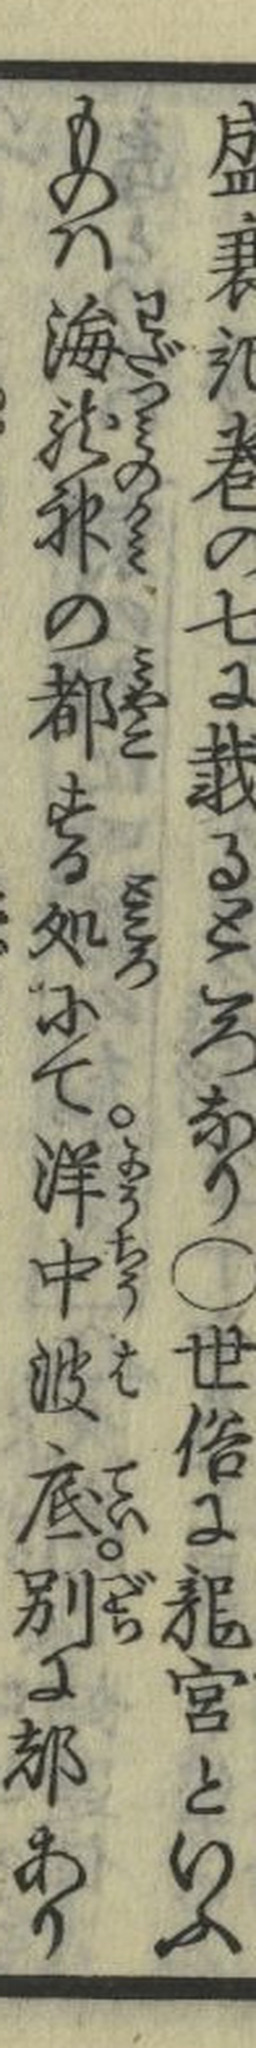ものは海竜神の都する処にて。洋中波底。別に都あり
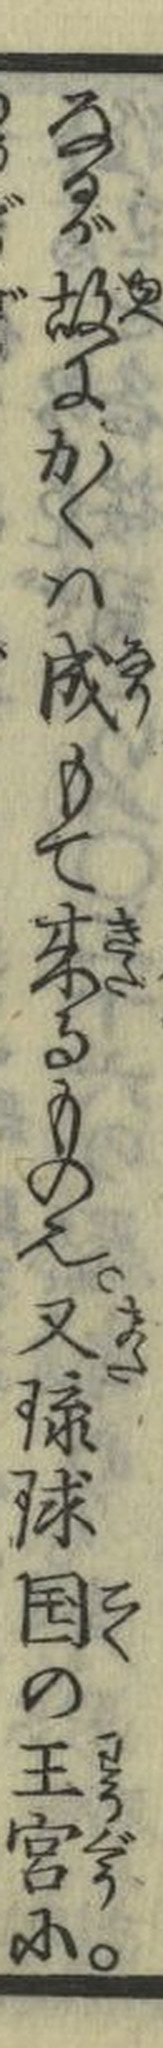なるが故にかくは成もて来るもの也。又琉球国の王宮に。
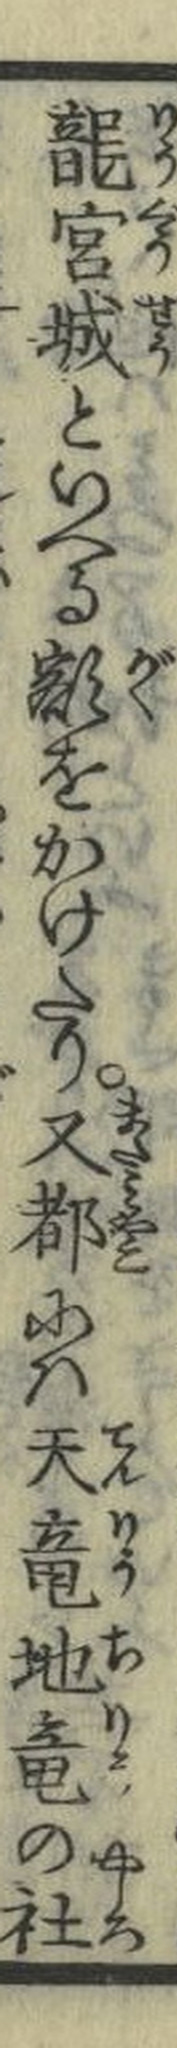竜宮城といへる額をかけたり。又都には天竜地竜の社
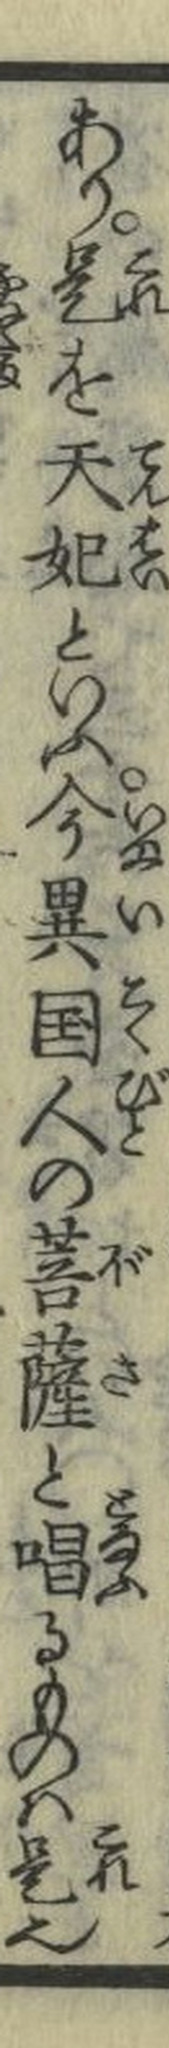あり。是を天妃といふ。今異国人の菩薩と唱るものは是也
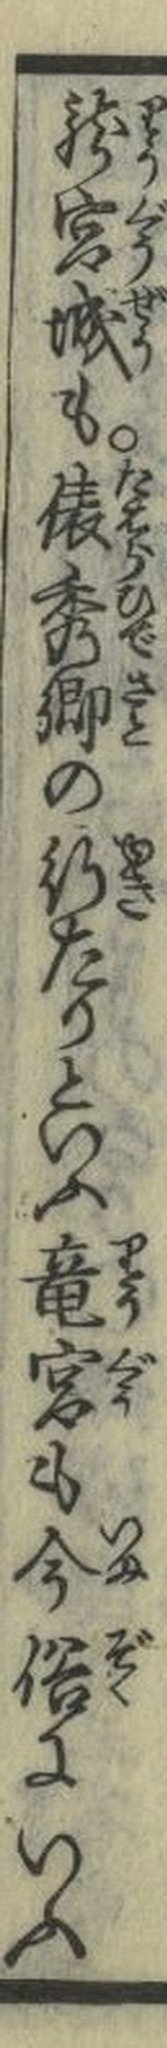竜宮城も。俵秀郷の行たりといふ竜宮も今俗にいふ

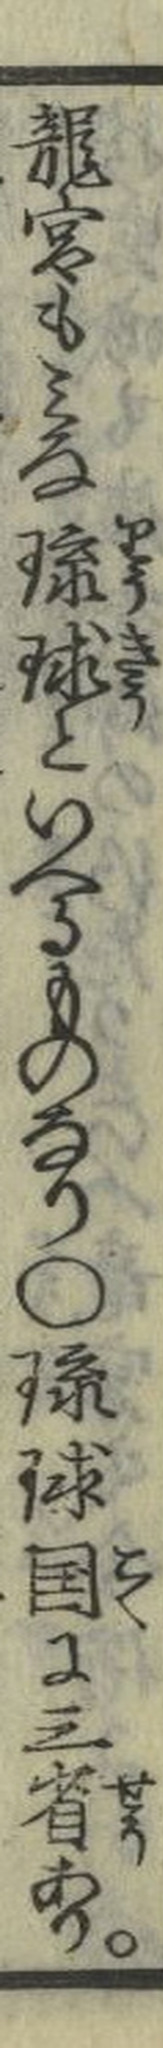竜宮もみな琉球といへるものなり○琉球国に三省あり。
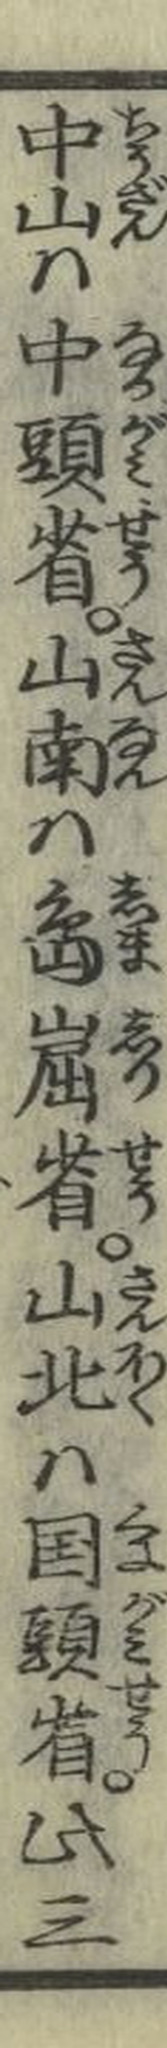中山は中頭省。山南は島崫省。山北は国頭省。此三
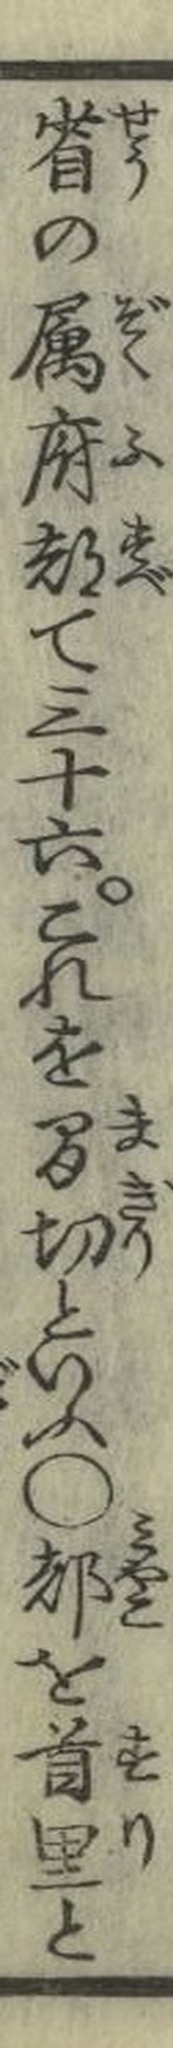省の属府都て三十六。これを間切といふ○都を首里と
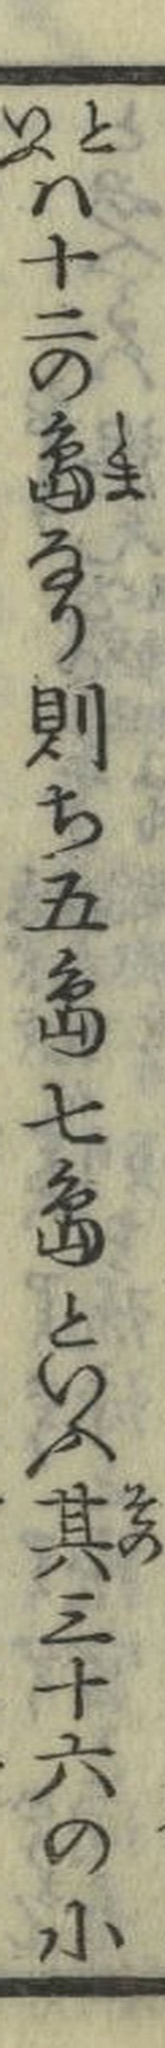といふは十二の島なり則ち五島七島といふ其三十六の小
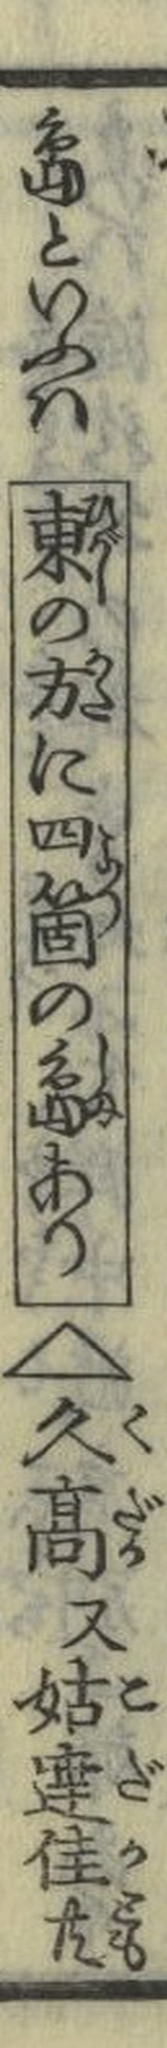島といふは「東の方に四箇の島あり」△久高又姑達佳共
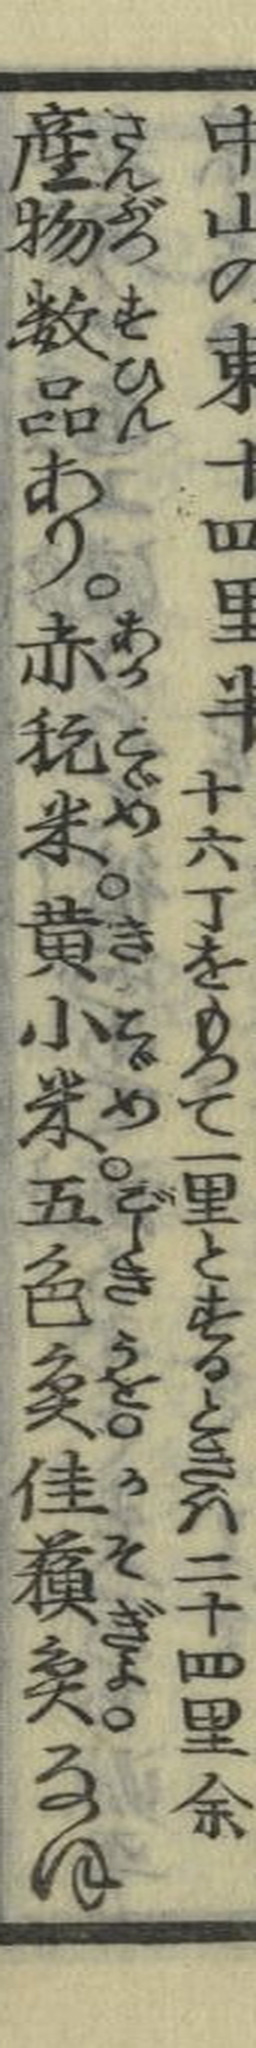産物数品あり。赤祝米。黄小米。五色魚。佳蘇魚。なほ
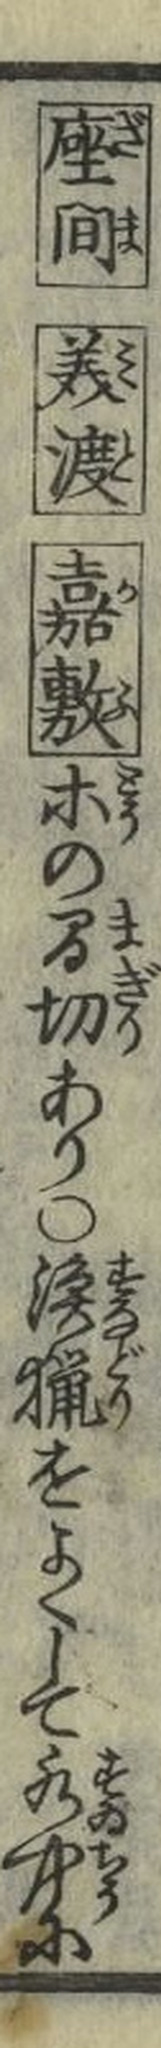「座間」「美渡」「嘉敷」等の間切あり○漁猟をよくして
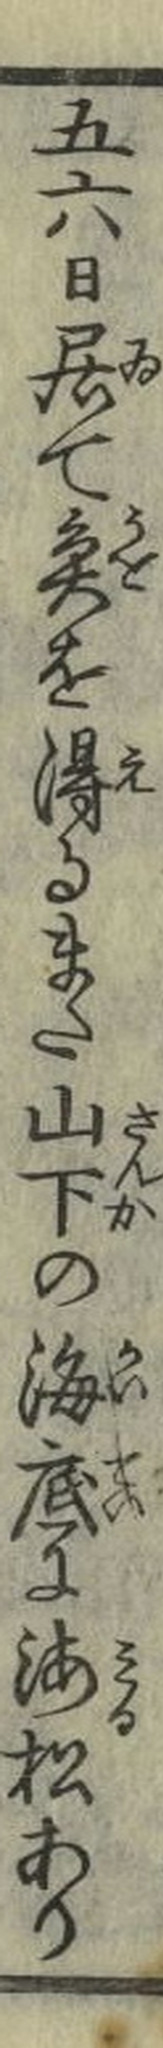五六日居て魚を得るまた山下の海底に海松あり
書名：琉球奇譚
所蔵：University of the Ryukyus Library
